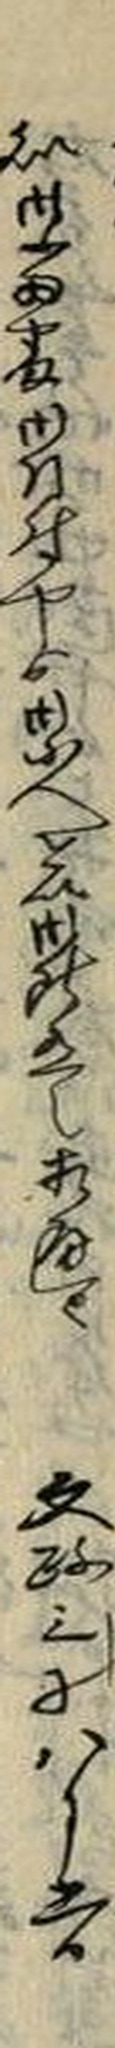処御当番御目付中ゟ御小人を以御断有之相通候文政三寅八月二日
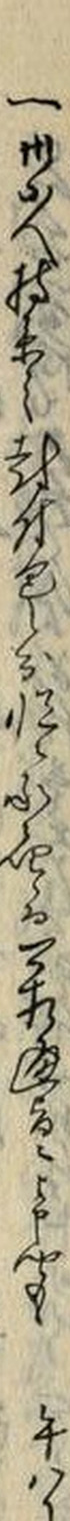一御小人持参之封付包之分慥に承届候而可相通候旨被申聞候午八月三日
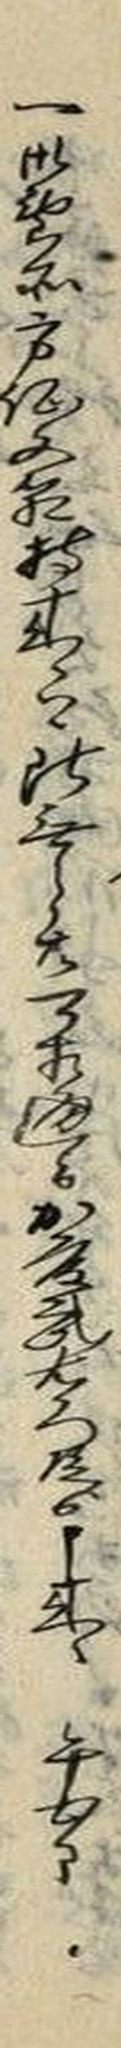一御台所方証文箱持来候はゝ断無之候共可相通旨加藤武右衛門殿ゟ申来候午五月
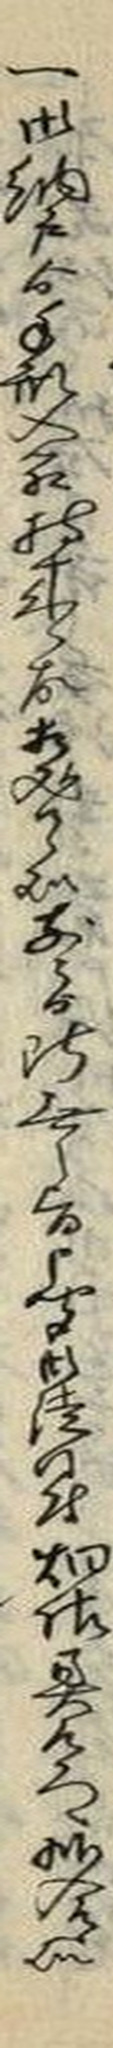一御納戸ゟ手形入箱持来候故相咎候処前々ゟ断無之旨申聞御徒目付畑佐奥左衛門へ掛合候処
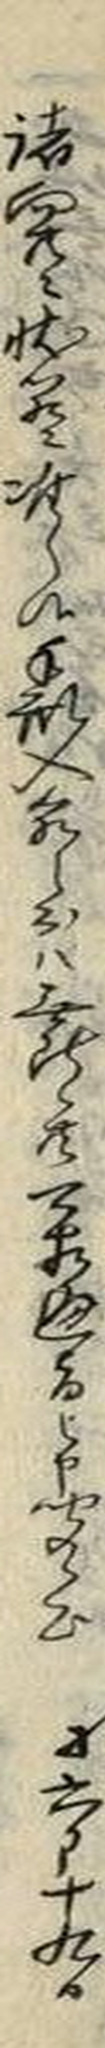諸向共に状箱に准し候手形入箱之分は無断候共可相通旨被申聞候以上寅六月十九日
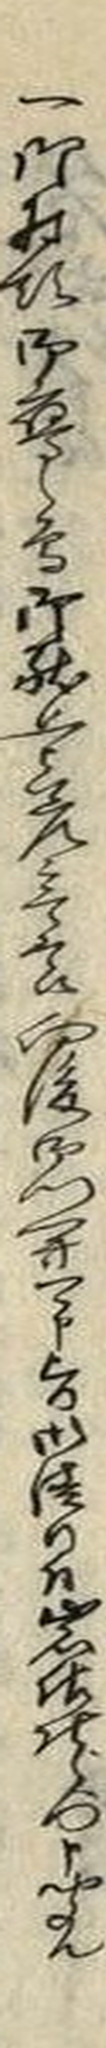一御拝領御鷹之鳥御献上被差置候節向後御門開可申旨御徒目付岩佐次郎右衛門申聞ル
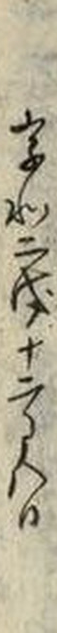享和二戌十二月八日
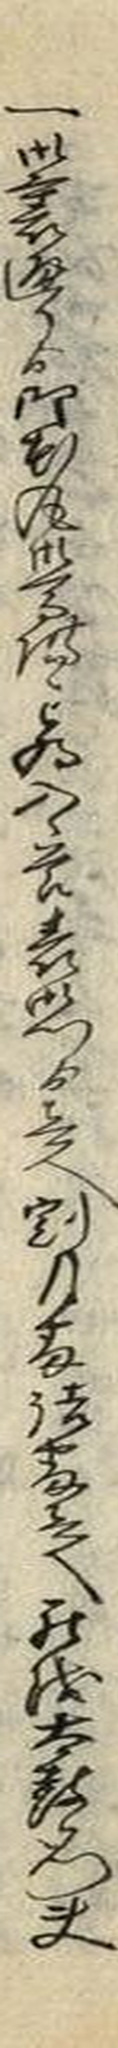一御裏通りゟ御本丸御馬場へ被為入候節表御門ゟ壱人割月番詰番壱人罷越太鼓御門夫
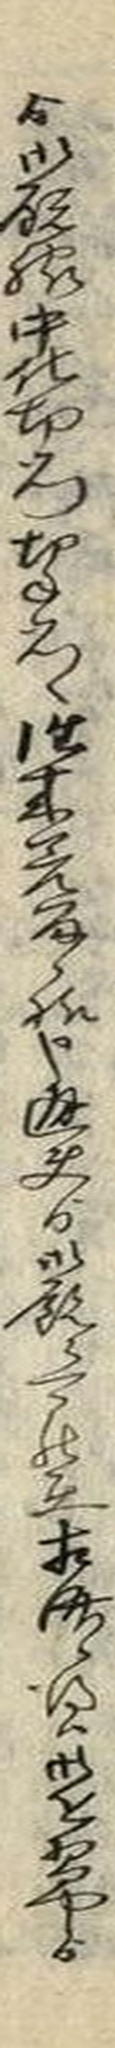ゟ御厩脇中仕切御門切手御門へ往来差留候様申通夫ゟ御厩に可罷在相済候得は御近習中ゟ
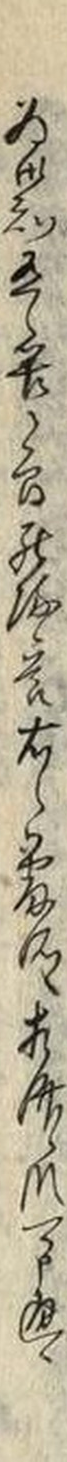為御知有之筈ニ候間罷帰候節右之御番所へ相済候段可申通候
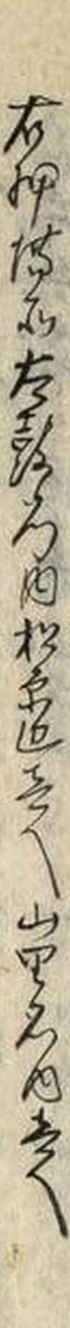右押場所太鼓御門内松原辺壱人山里御門内壱人
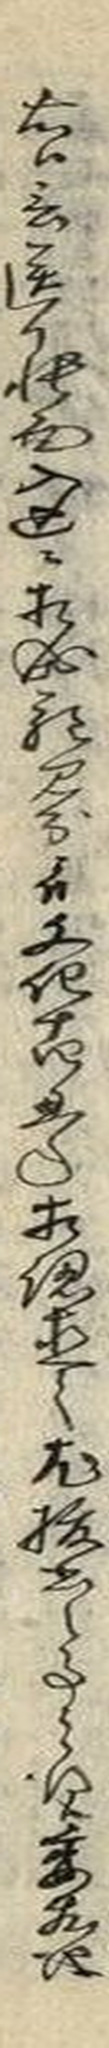右は言送り帳面入込に相成難見分に付文化十四丑年相認直之尤抜書之事に候得は委敷儀
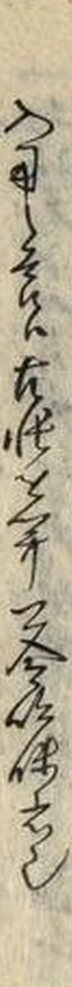入用之節は古帳を開可令吟味者也
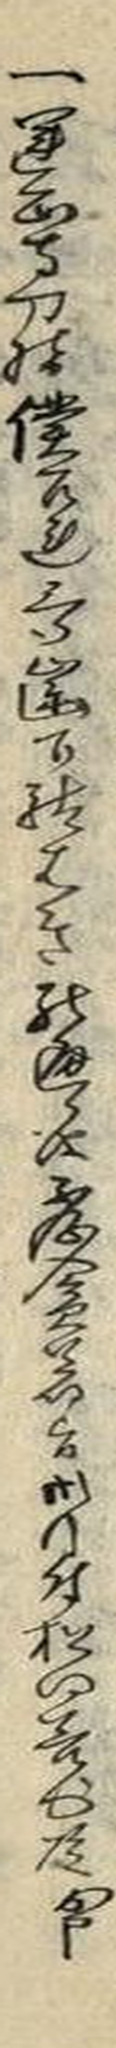一運正寺刀指僕召連三ツ歯下駄はき罷通候儀不及貪着旨御目付松田善右衛門殿ゟ申

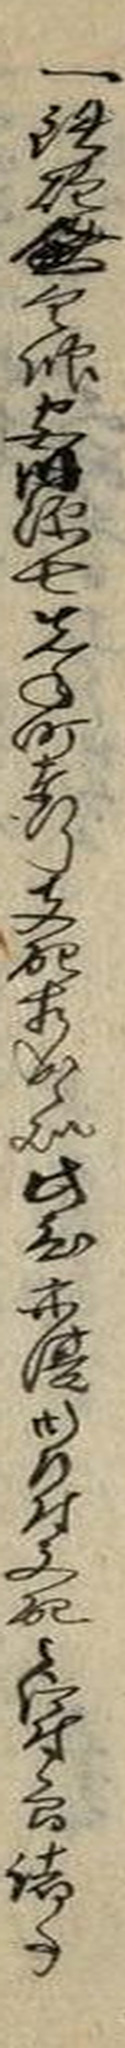一鉄砲金具師宮田源七先年町奉行支配相成候処此度木履御目付支配被仰付候間諸事
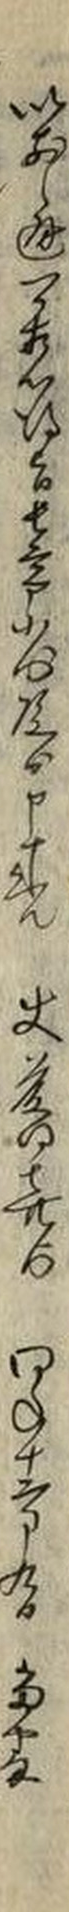以前之通可相心得旨長谷部小右衛門殿ゟ申来ル使藤田喜右衛門同年十二月九日当番
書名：御門御櫓之部
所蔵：福井県文書館 Fukui Prefectural Archives
